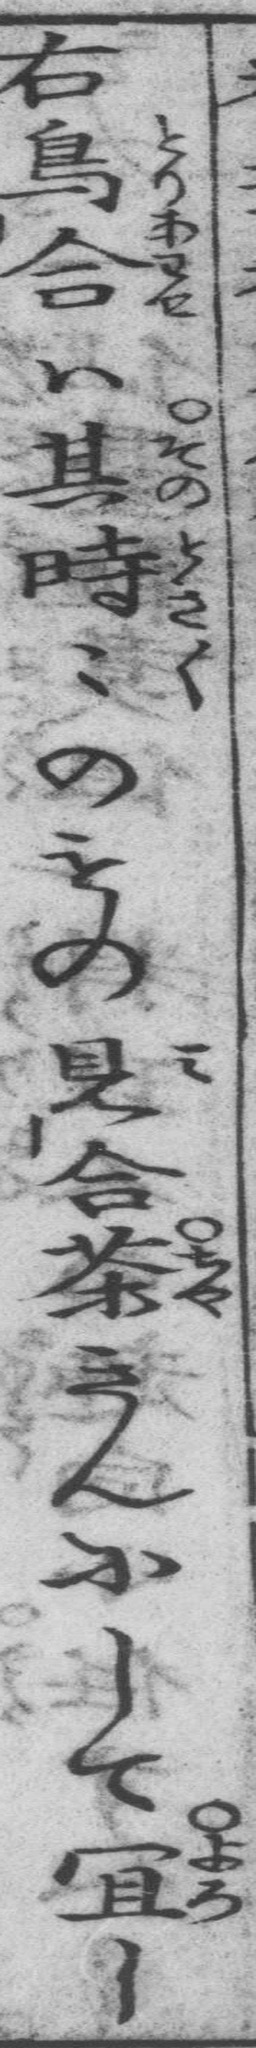右鳥合は。其時々のもの見合。茶きんにして。宜し
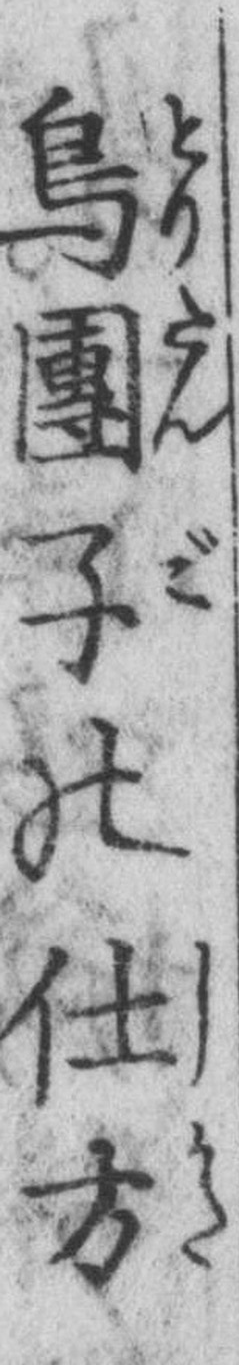鳥団子の仕方
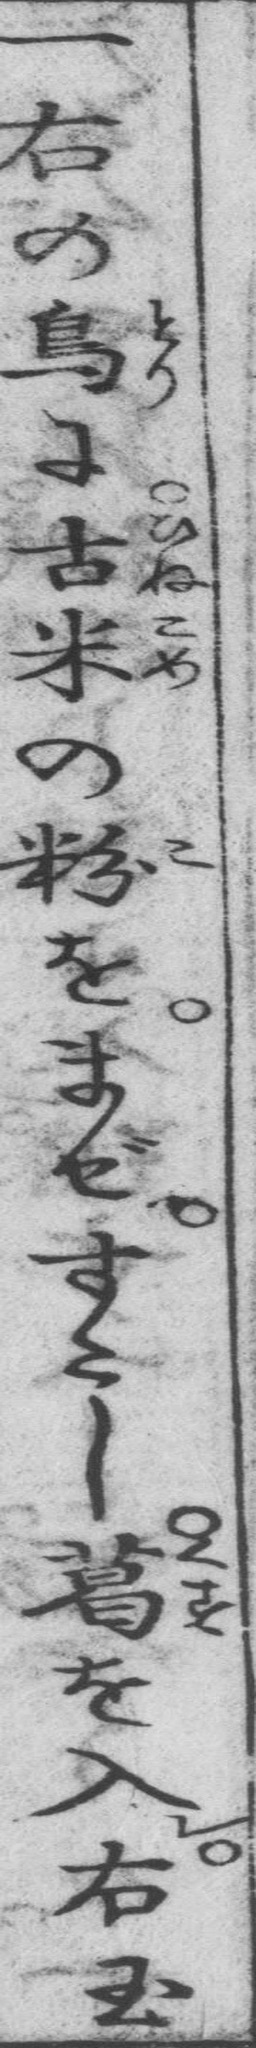一右の鳥に。古米の粉を。まぜ。すこし。葛を入れ。右玉
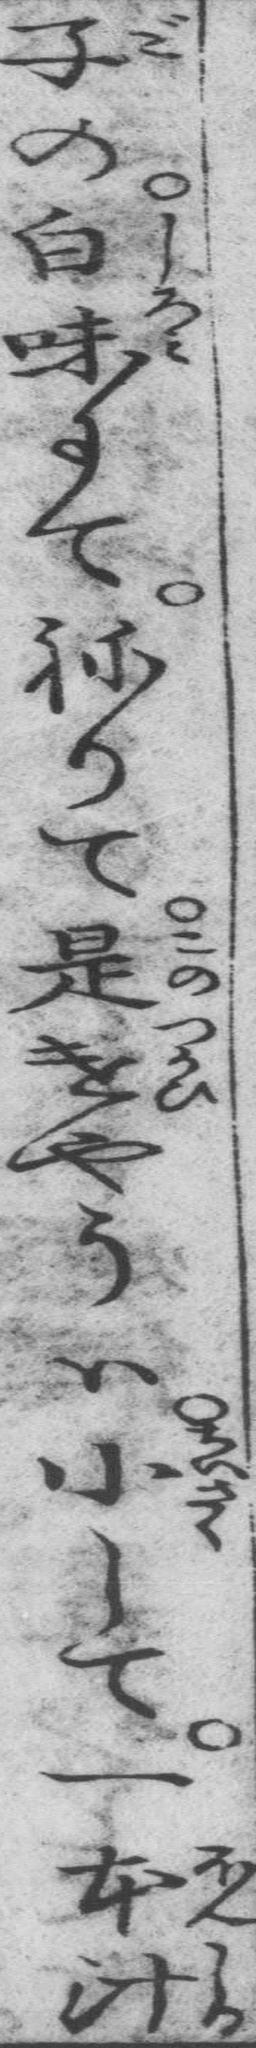子の。白味にて。ねりて。是遣やうは。小して。一本汁
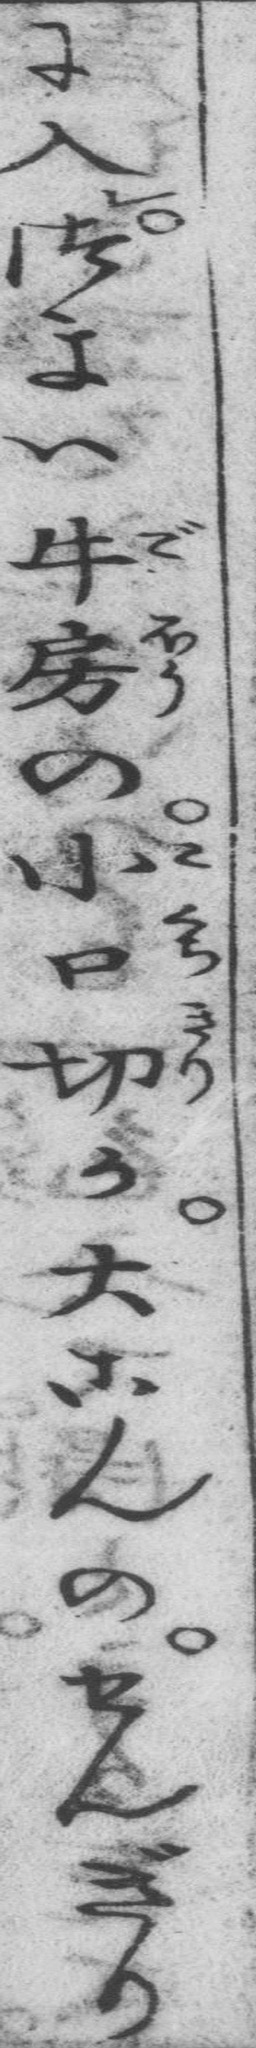に入れ。つまは牛房の。小口切か。大こんの。せんぎり
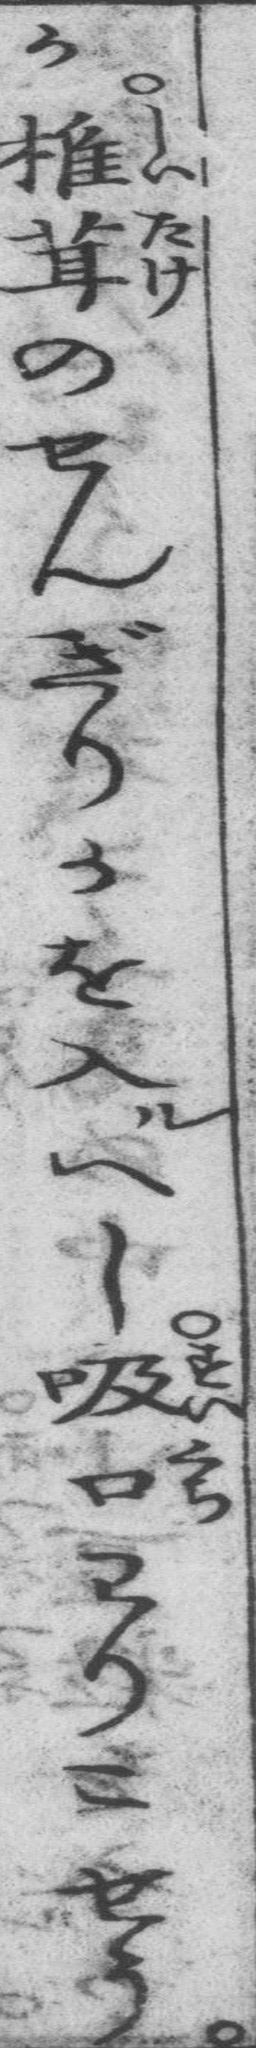か。椎茸のせんぎりかを入るへし。吸口わりこせう。
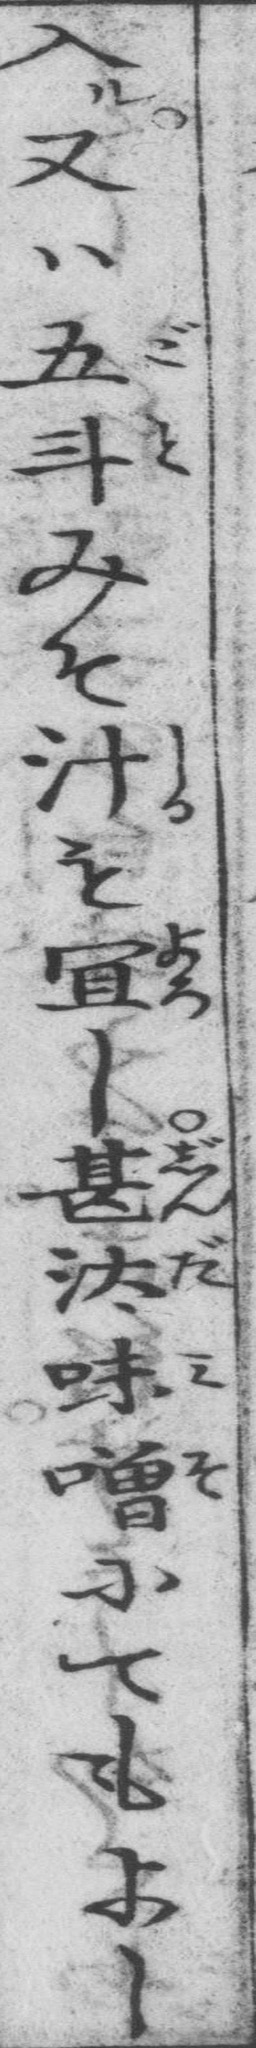入る。又は五斗みそ汁も宜し。甚汰味噌にてもよし
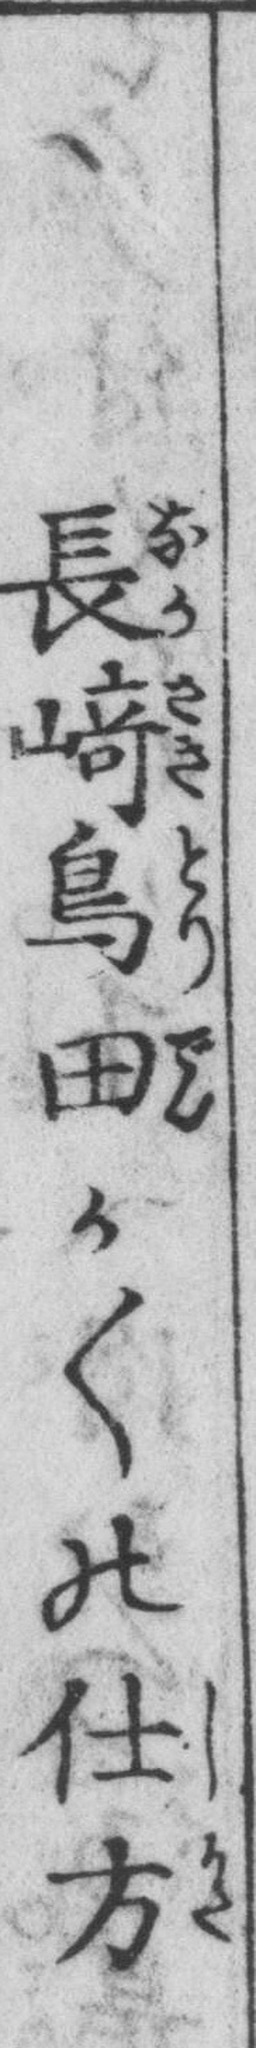長崎鳥田かくの仕方
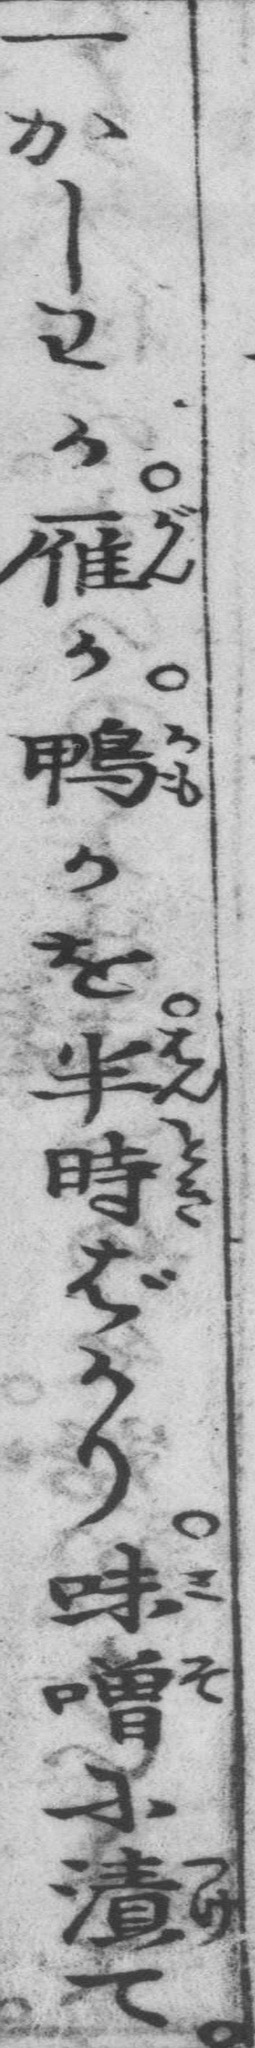一かしわか。雁か。鴨かを。半時ばかり。味噌に漬て。
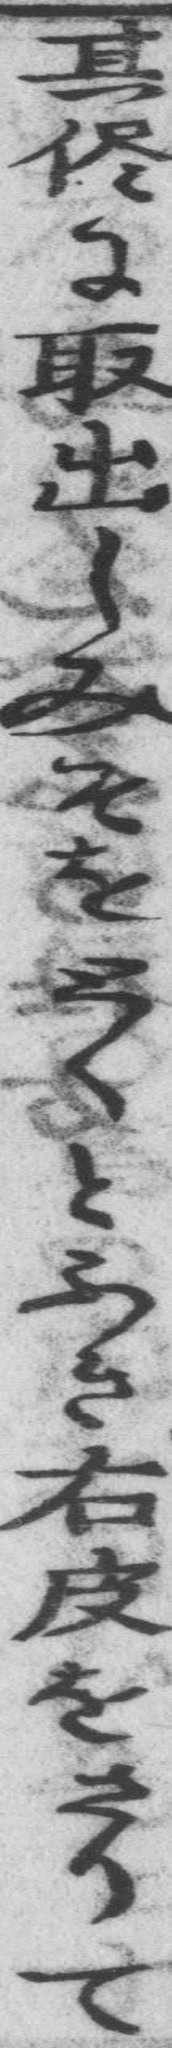其侭に。取出し。みそをとくとふき。右皮をさりて
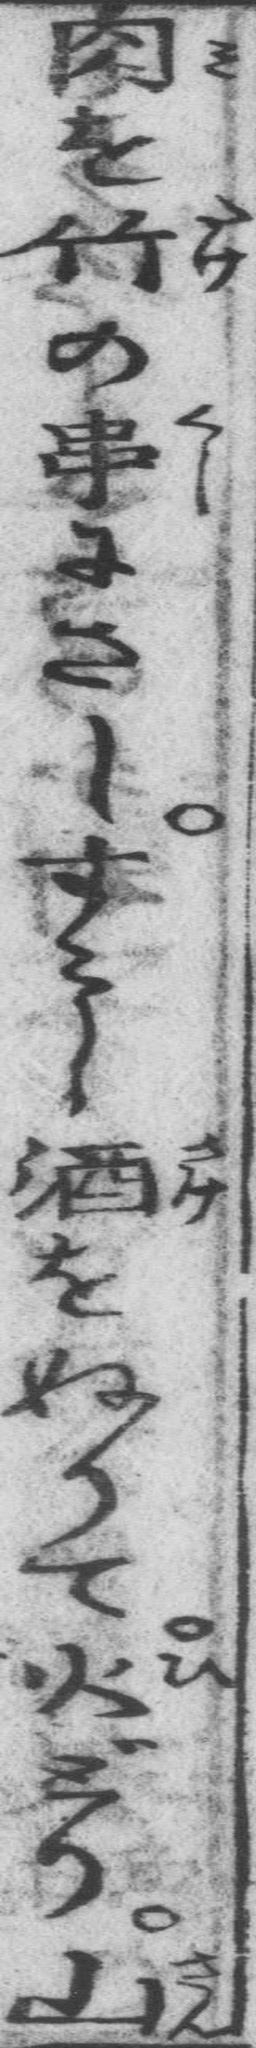肉を竹の串にさし。すこし酒をぬりて。火どり。山
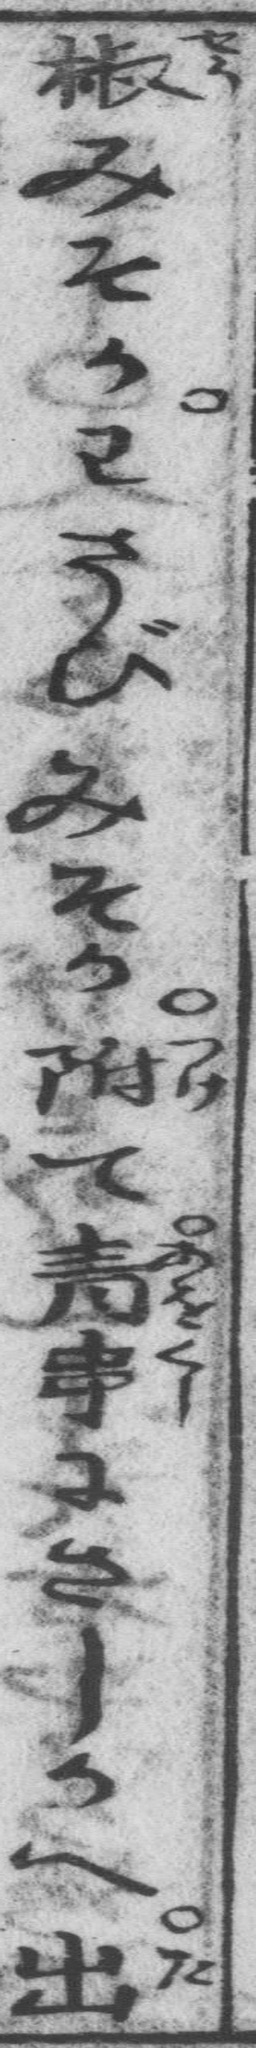椒みそか。わさびみそか。附て、青串にさしかへ。出
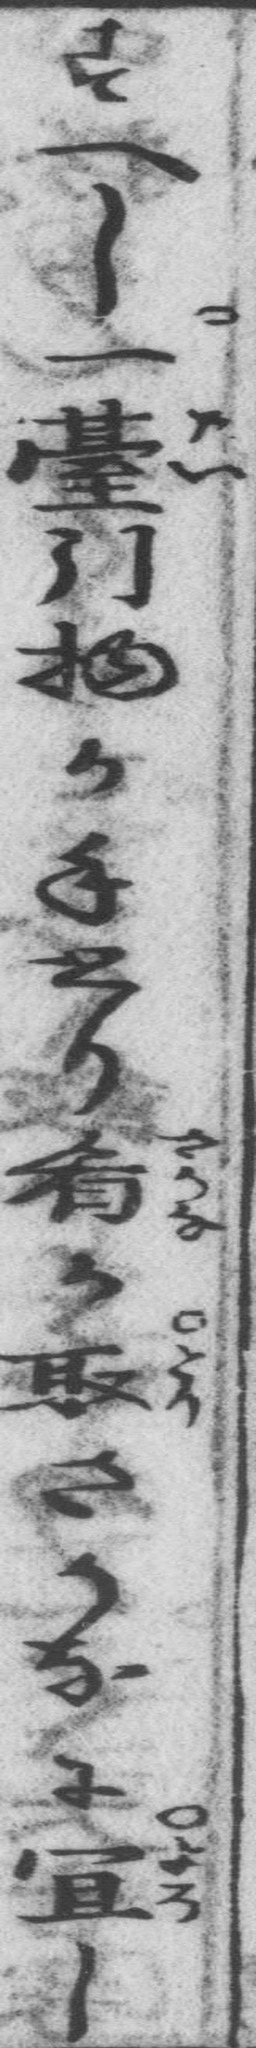すへし。一台引物か手とり肴か。取さかなに。宜し
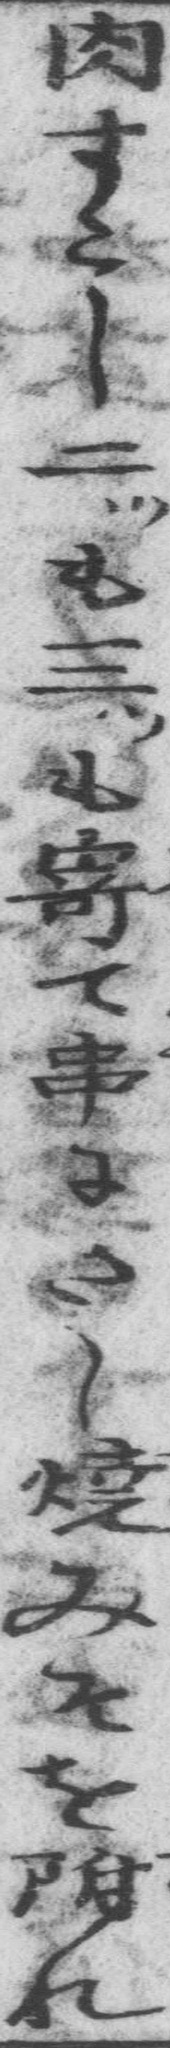肉すこし。二つも三つも寄て。串にさし焼。みそを附れ
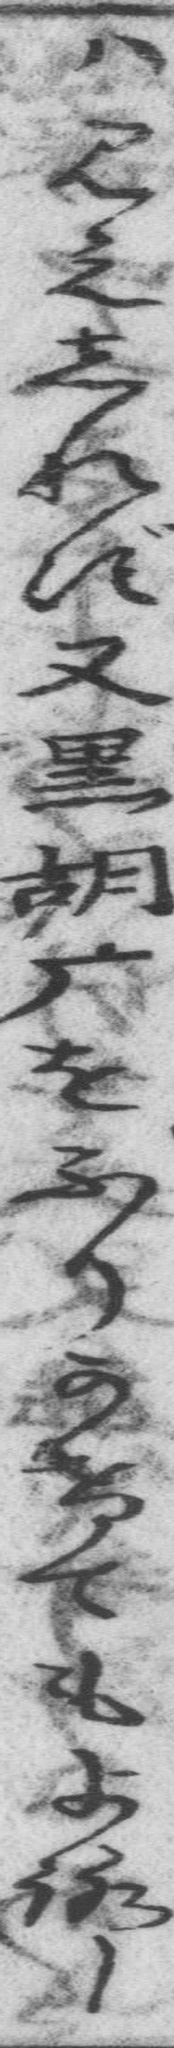ば。見えしれず。又黒胡麻を。ふりかけても。よろし
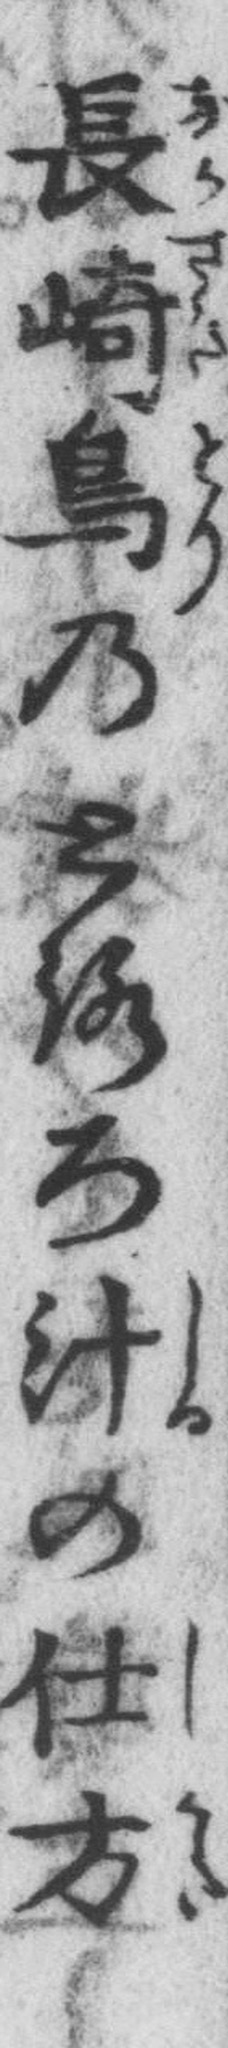長崎鳥のとろろ汁の仕方
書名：萬寳料理秘密箱
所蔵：大阪府立大学学術情報センター 国文学研究資料館
